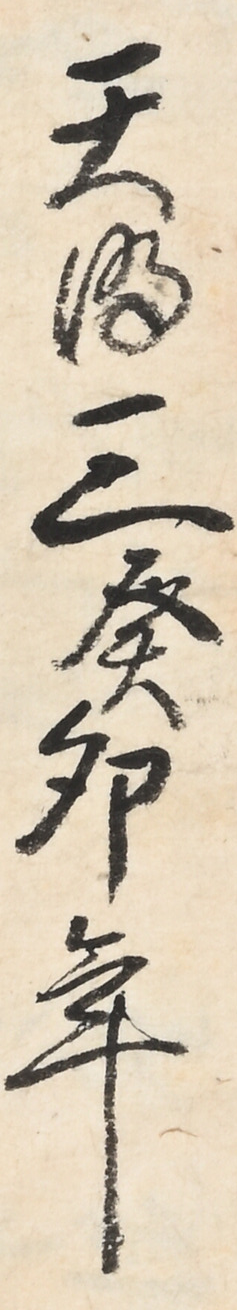天明三癸卯年
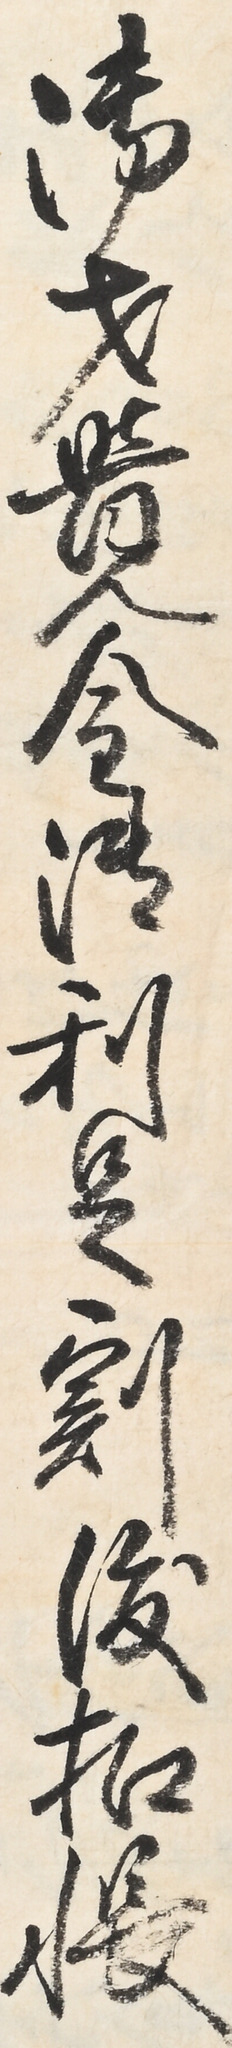御才覚金御利息割渡扣帳

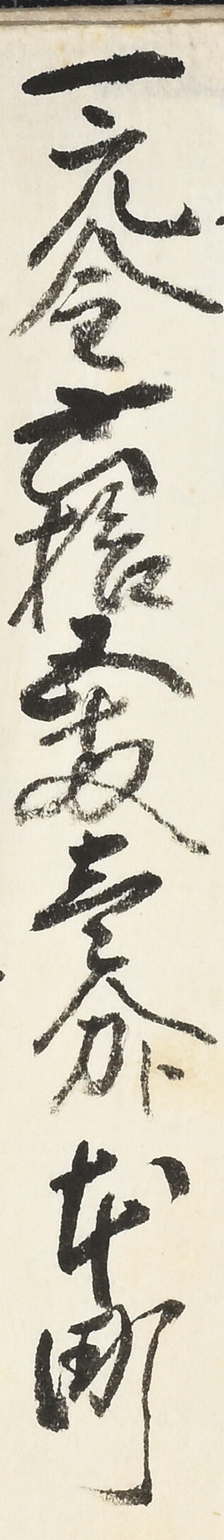元金六拾五両壱分ト本町
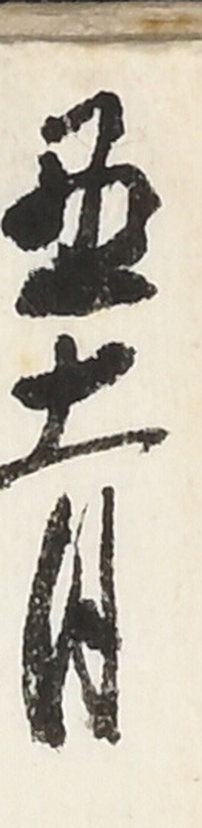丑十一月
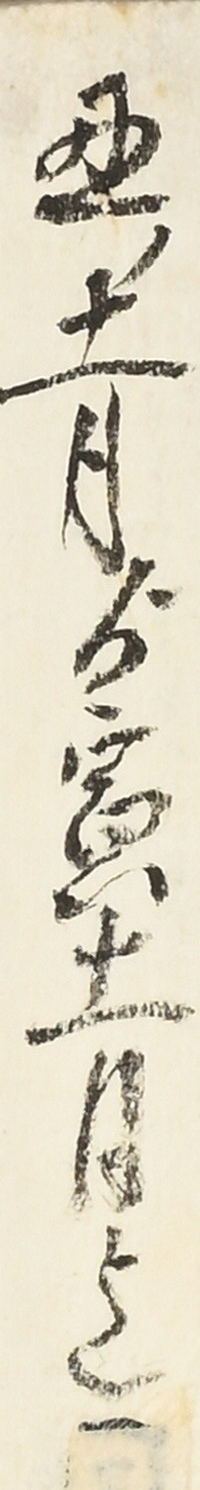丑ノ十一月ゟ寅十一月迄
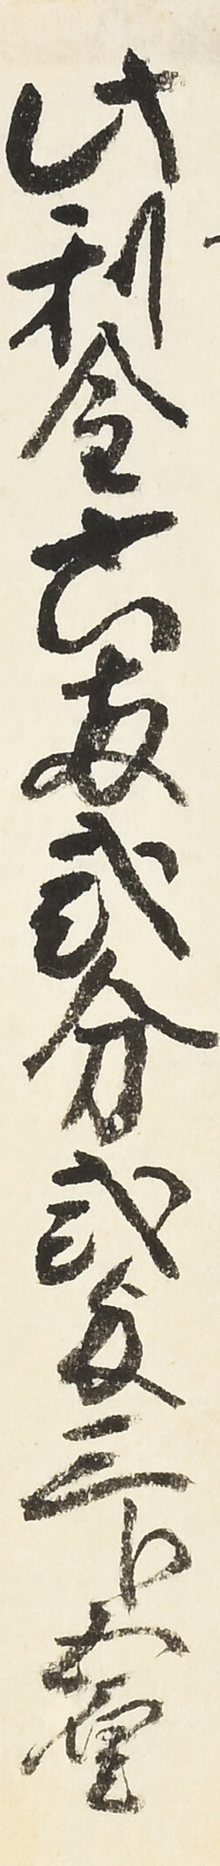此利金六両弐分弐匁三分五厘
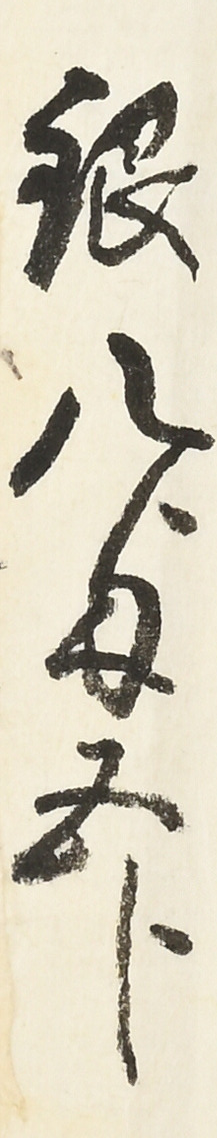銀八匁五分
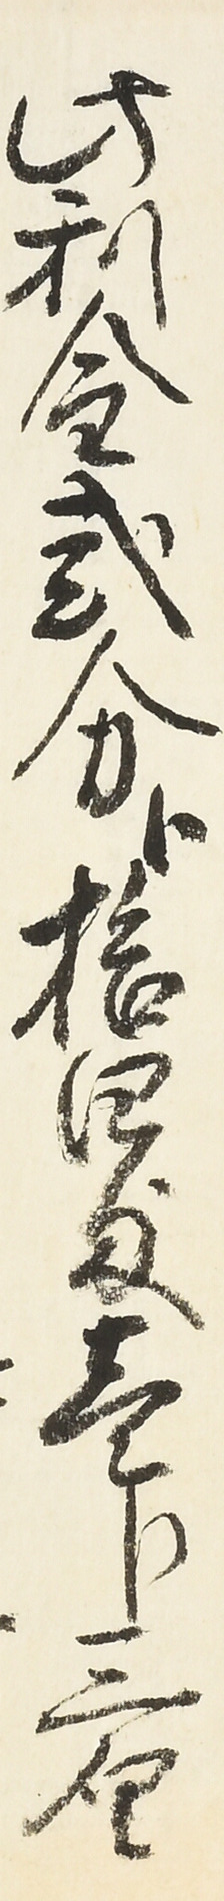此利金弐分ト拾四匁壱分三里
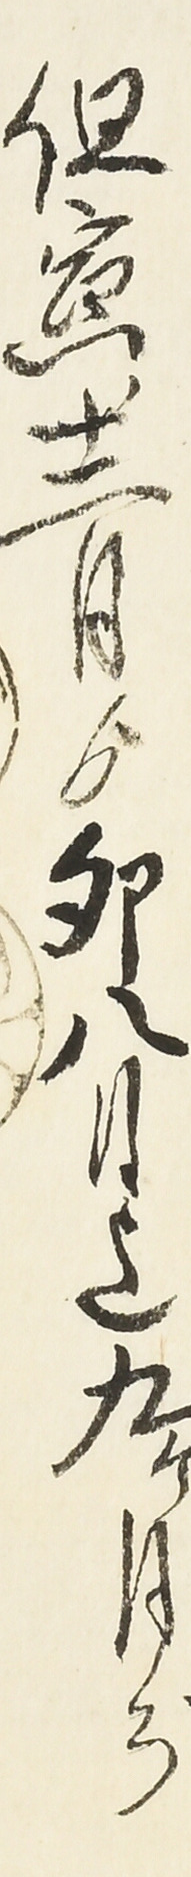但寅ノ十二月ゟ卯八月迄九ヶ月分
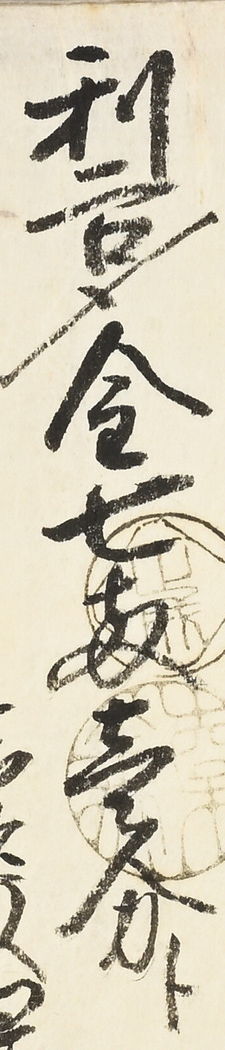利二口〆金七両壱分ト
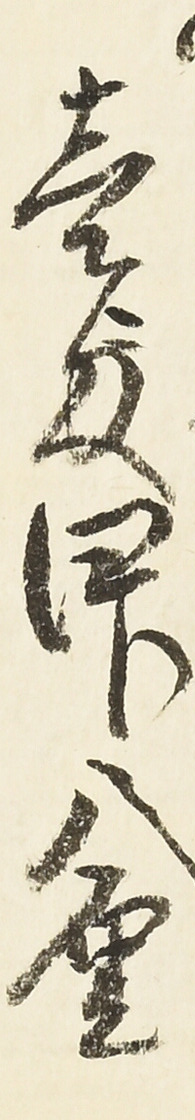壱匁四分八厘
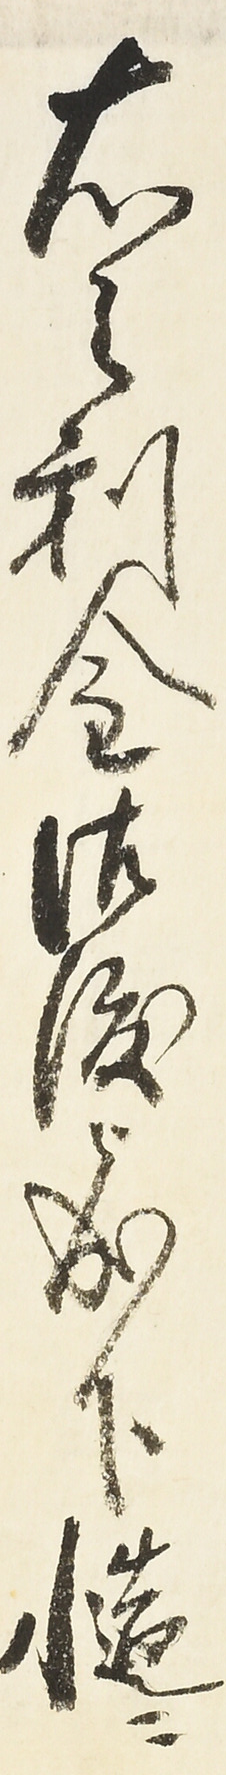右之利金御渡被成下慥ニ
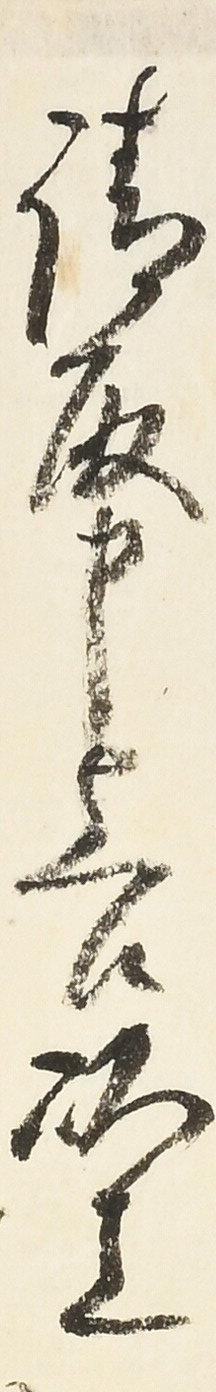請取申上候以上
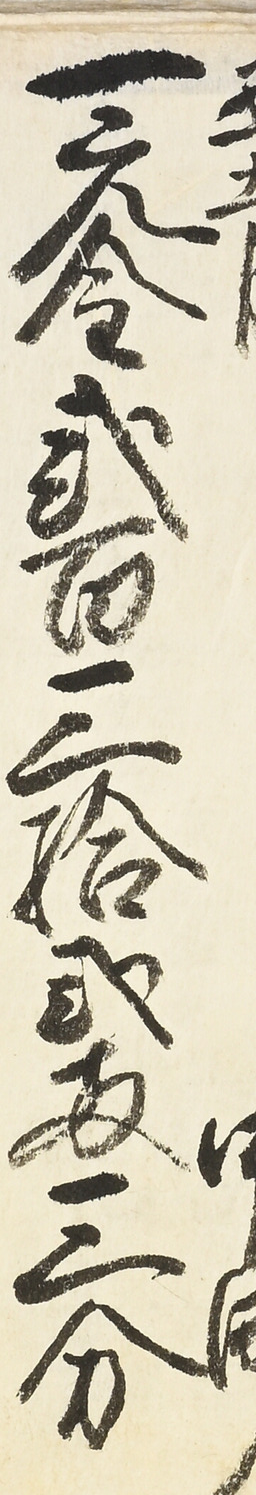一元金弐百三拾弐両三分
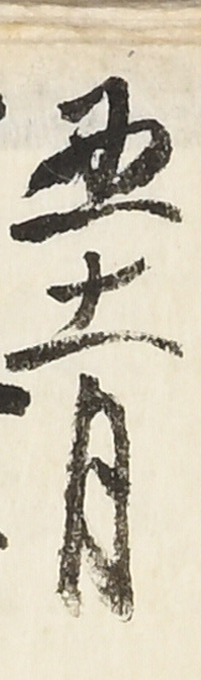丑十一月
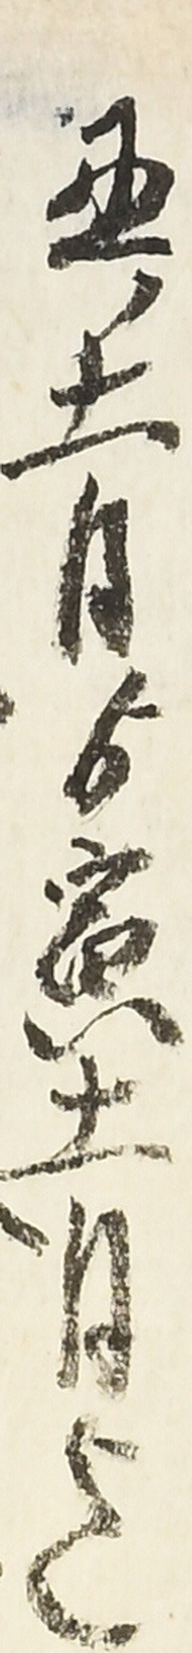丑ノ十一月ゟ寅十一月迄
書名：御才覚金御利足割渡扣帳
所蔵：伊那市立高遠町図書館・合同会社AMANE
